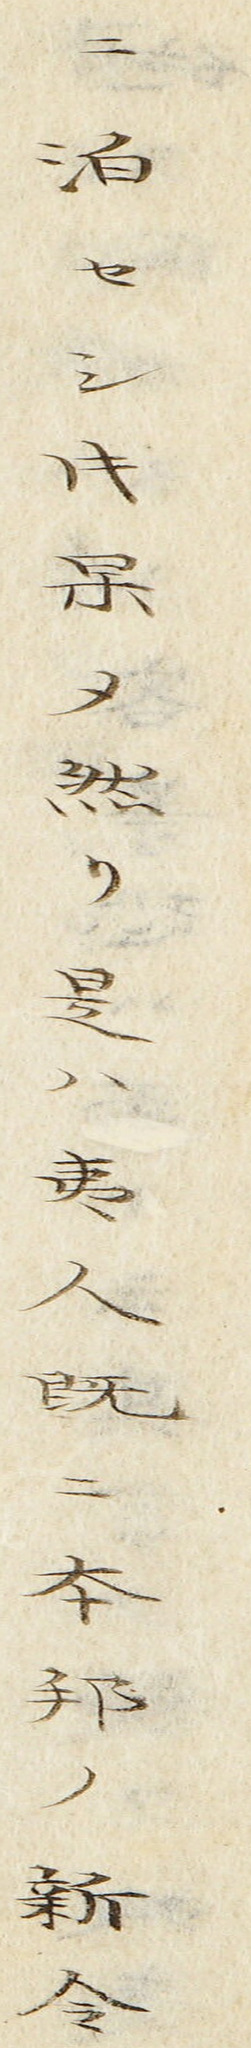ニ泊セシトキ果シテ然リ是ハ夷人ニ本邦ノ新令
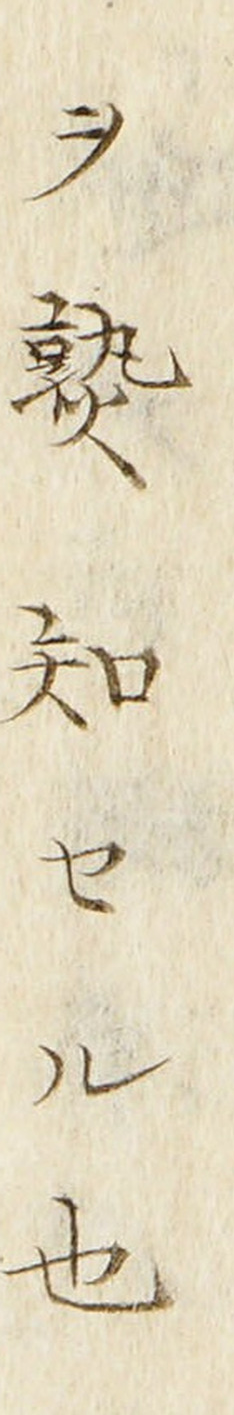ヲ熟知セル也
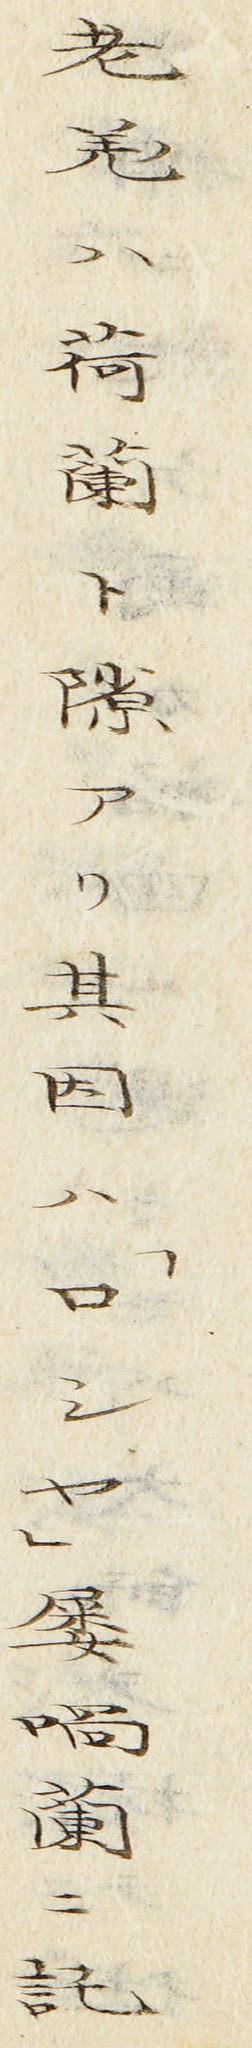〇老羗ハ荷蘭ト隙アリ其因ハ「ロシヤ」屡喎蘭ニ託
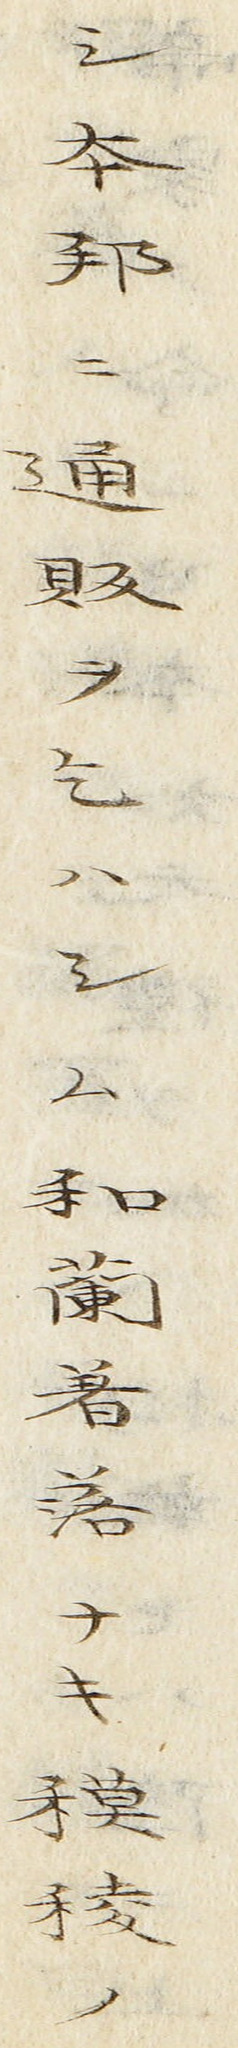シ本邦ニ通販ヲ乞ハシム和蘭着落ナキ稜ノ
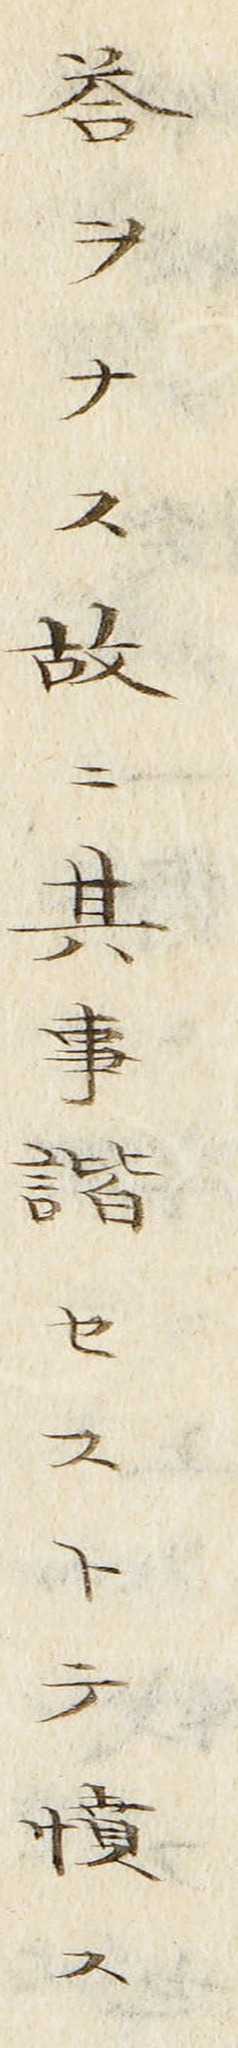答ヲナス故ニ其事諧セストテ憤ス
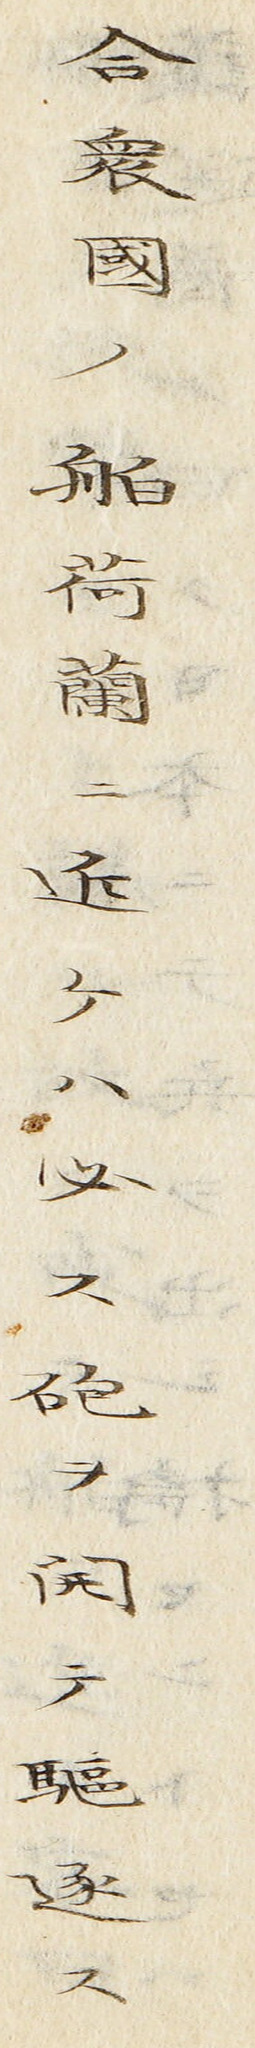〇合衆國ノ舶荷蘭ニ近ケハ必ス砲ヲ開テ驅逐ス
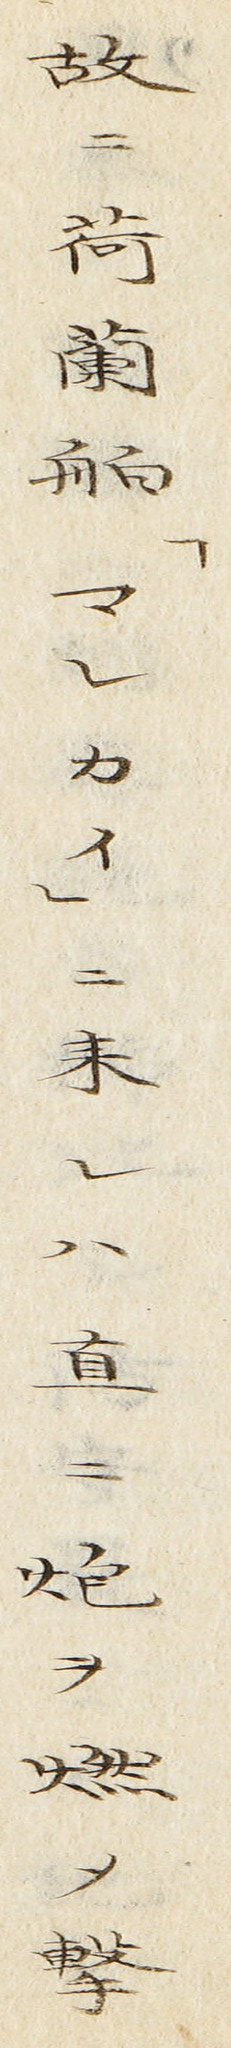故ニ荷蘭舶「マレカイ」ニ来レハ直ニ炮ヲ燃シテ撃
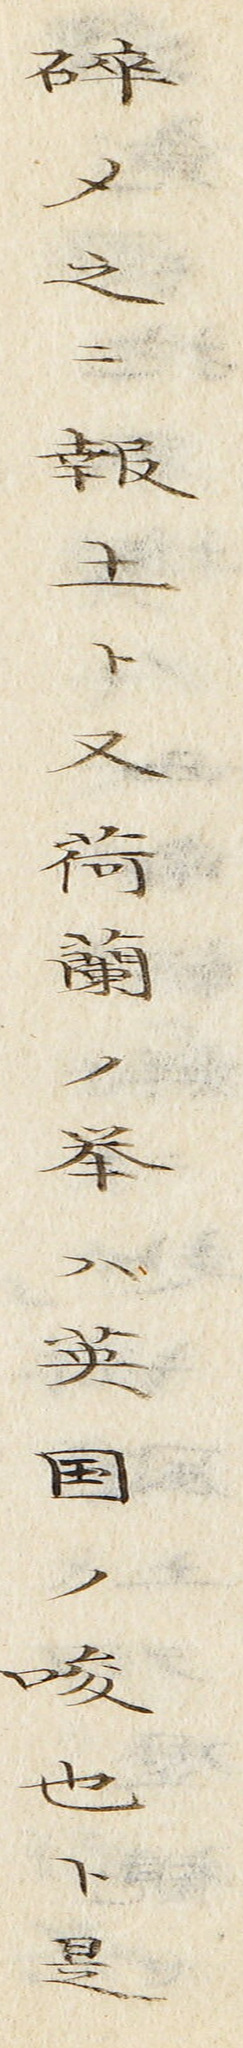碎シテ之ニ報土ト又荷蘭ノ挙ハ英国ノ唆也ト是
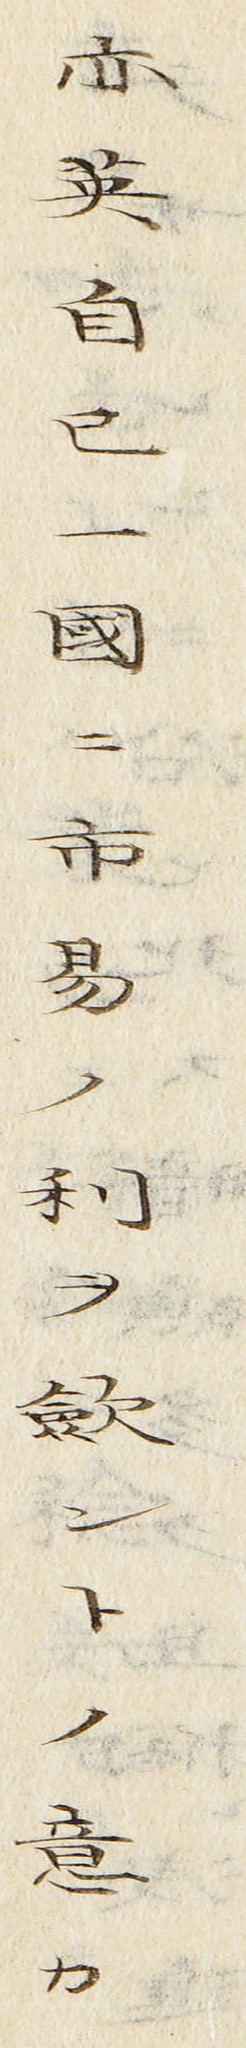亦英自己一國ニ市易ノ利ヲ歛ントノ意カ
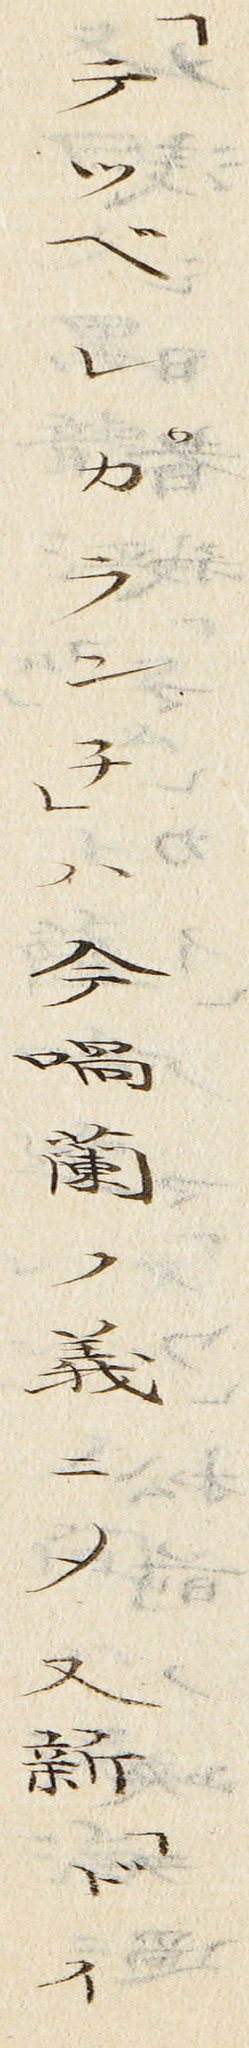〇「テツベレガランネ」ハ今喎蘭ノ義ニシテ又新「ドイ
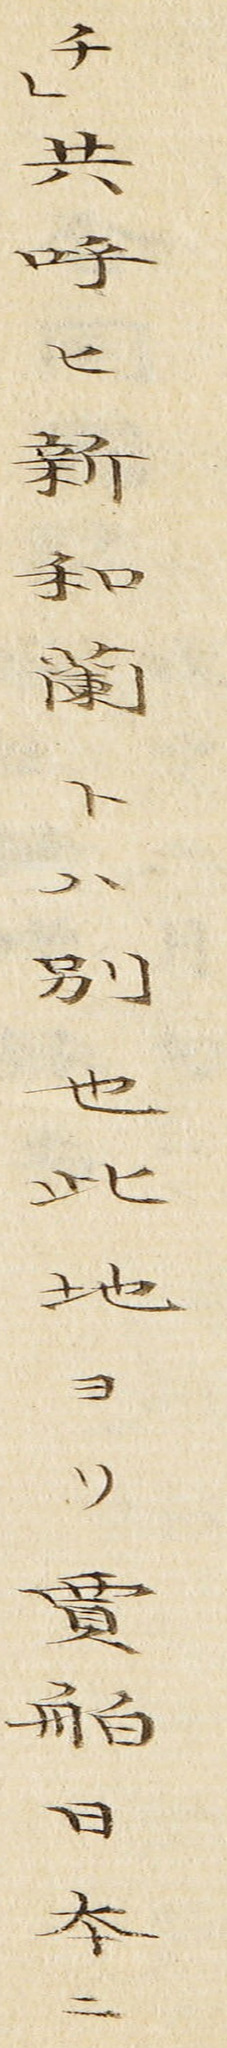チ」共呼ヒ新和蘭トハ別也此地ヨリ賈舶日本ニ
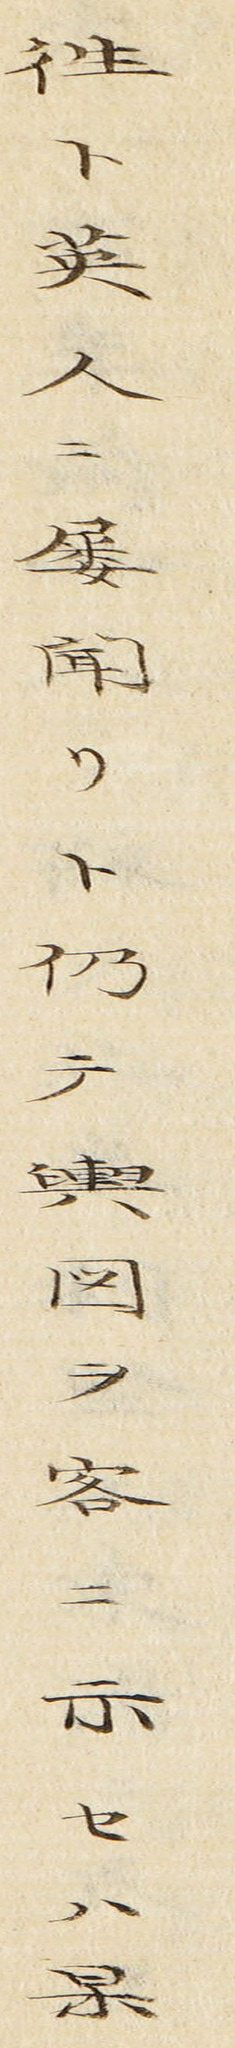往ト英人ニ屡聞リト仍テ輿図ヲ客ニ示セハ果
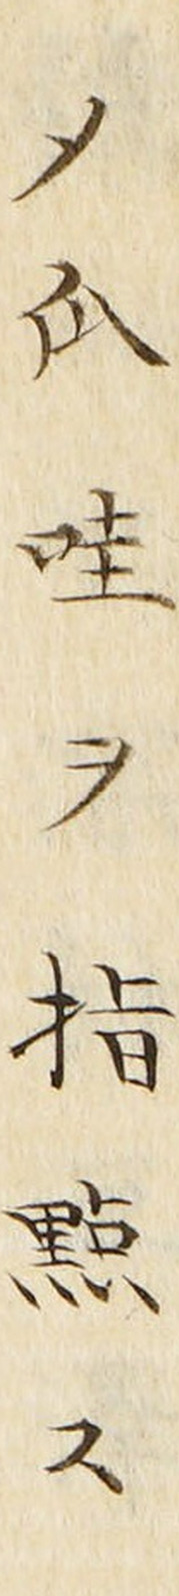シテ瓜哇ヲ指點ス
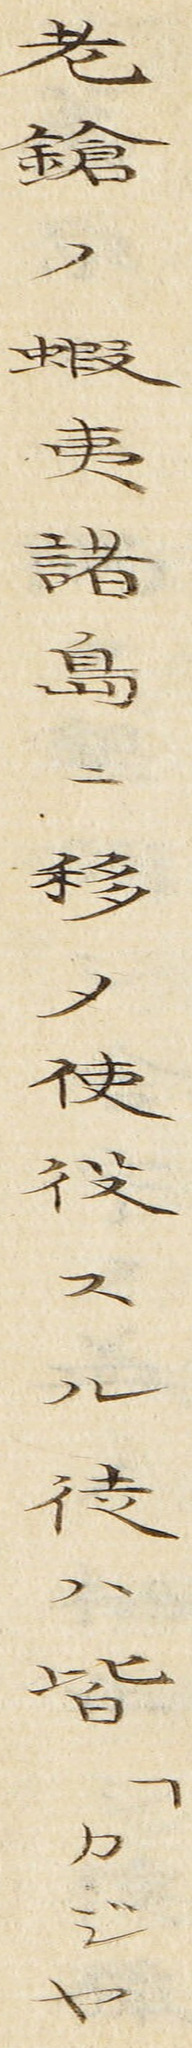〇老鎗ノ蝦夷諸島ニ移シテ使役スル徒ハ皆「カジヤ
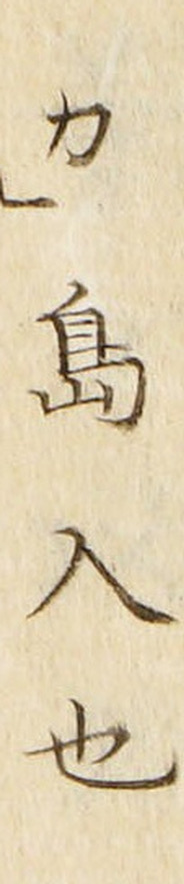カ」島人也
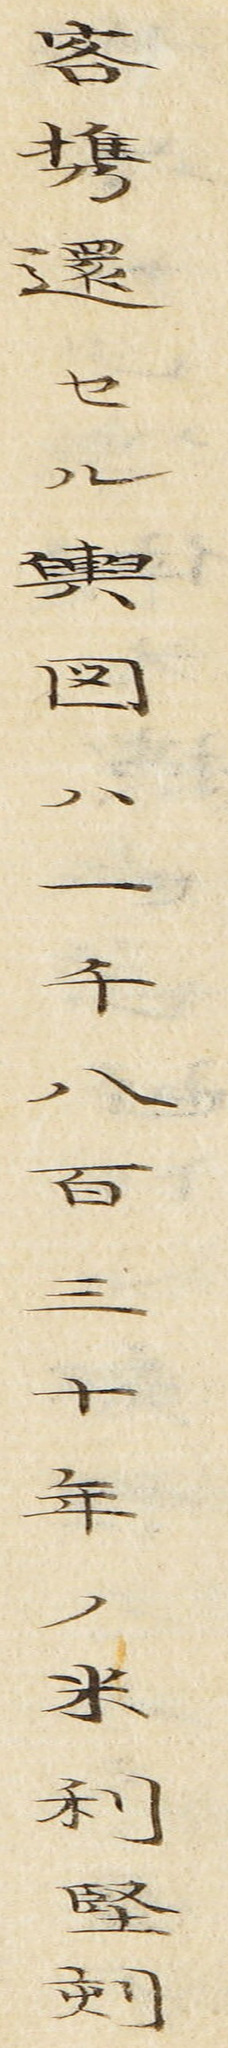〇客携還セル輿図ハ一千八百三十年ノ米利堅刻
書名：蕃談
